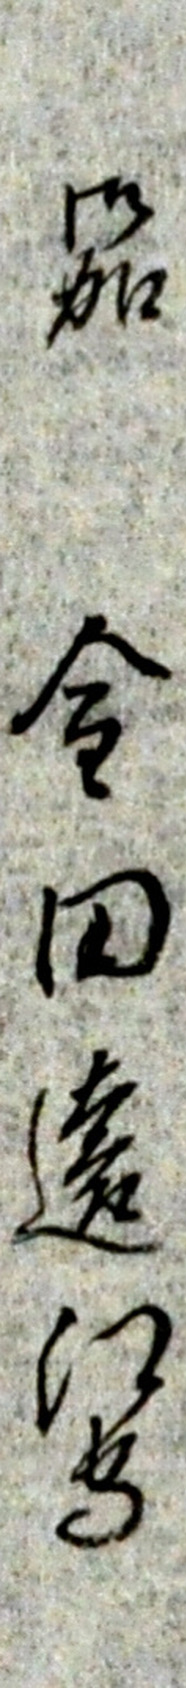御加金田遠江守
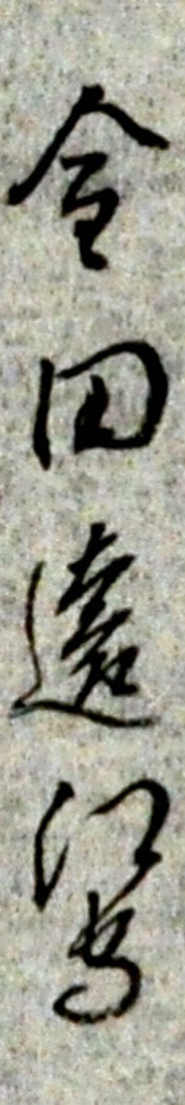御加金田遠江守
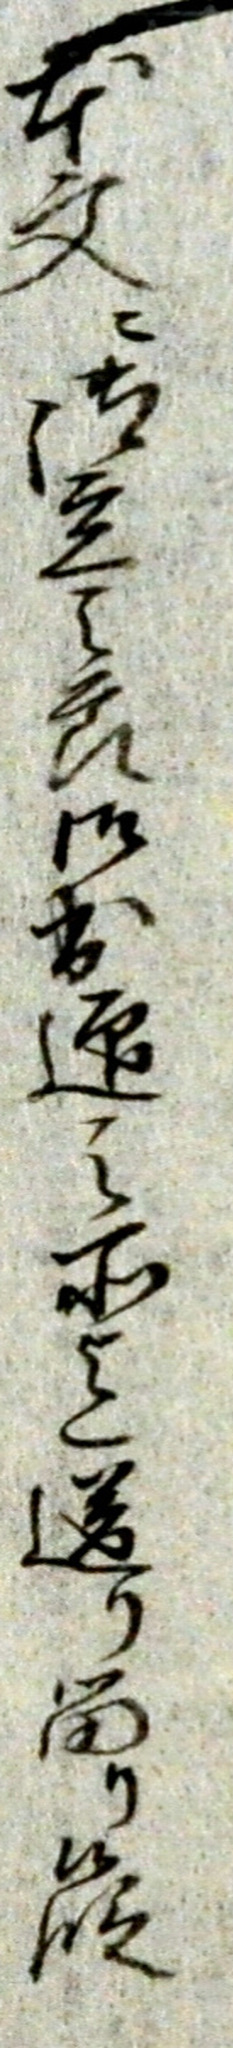本文ニ御立之節御出迎之所迄送り留り候段
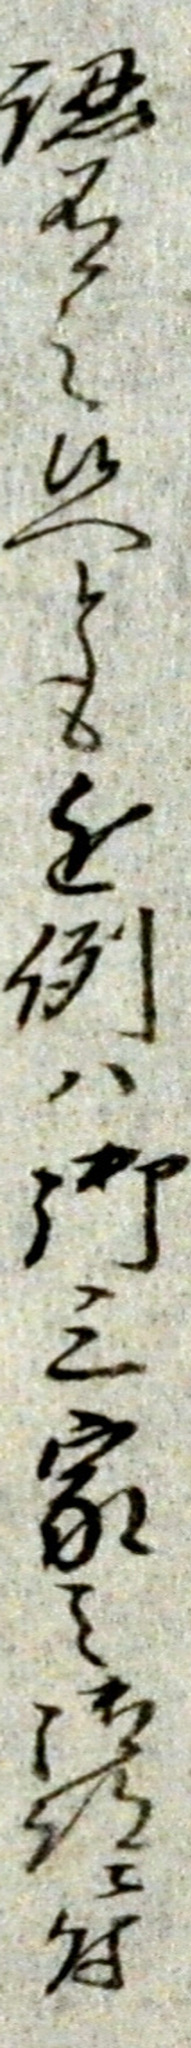認有之候へとも近例ハ御三家之御跡に付
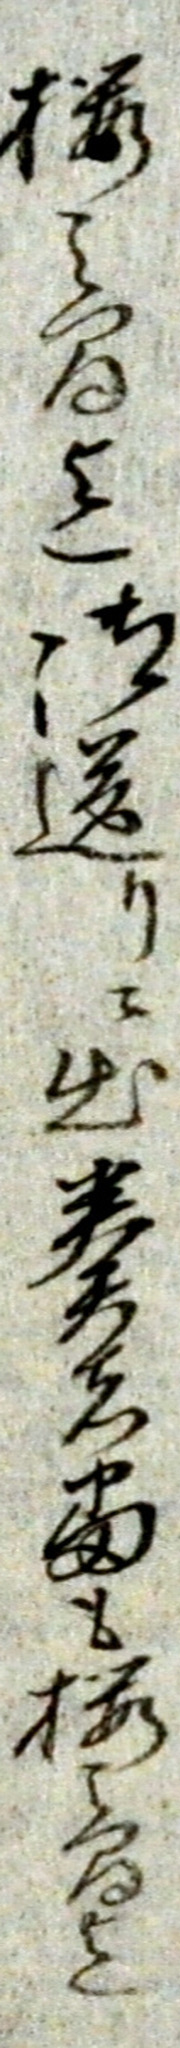桜之間迄御送りニ出奏者番も桜之間迄
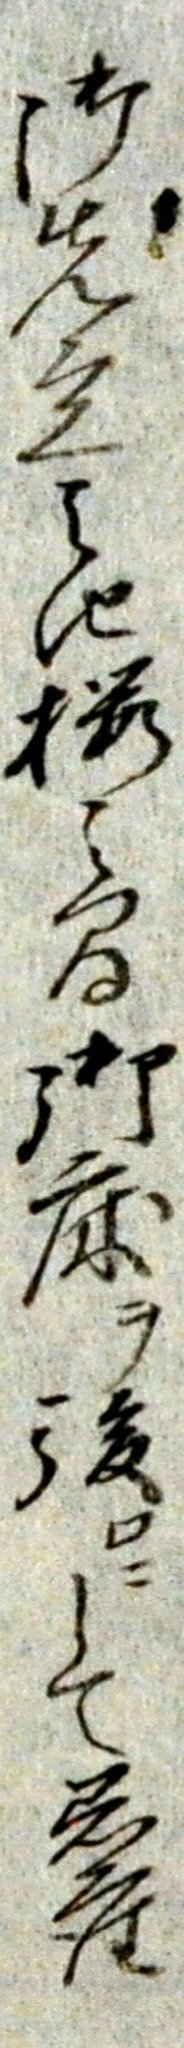御先立之由桜之間御床ヲ後ロニして着座
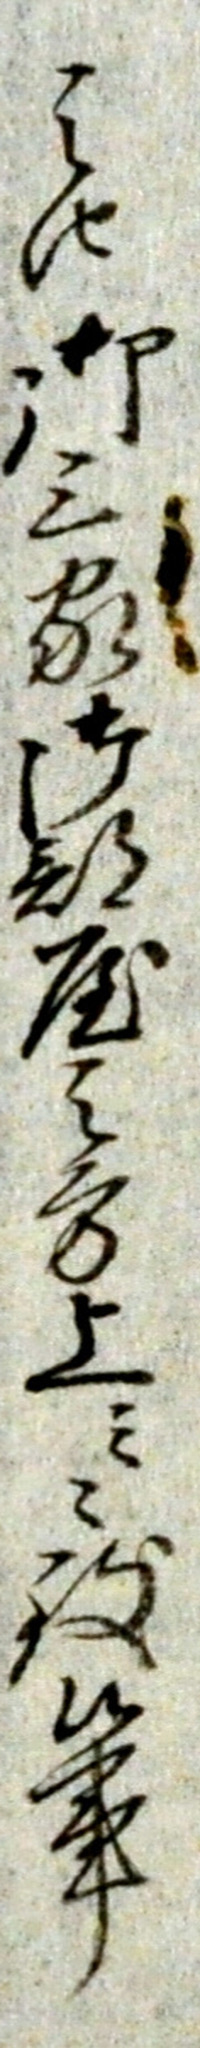之由御三家御部屋之方上ミニ致候事
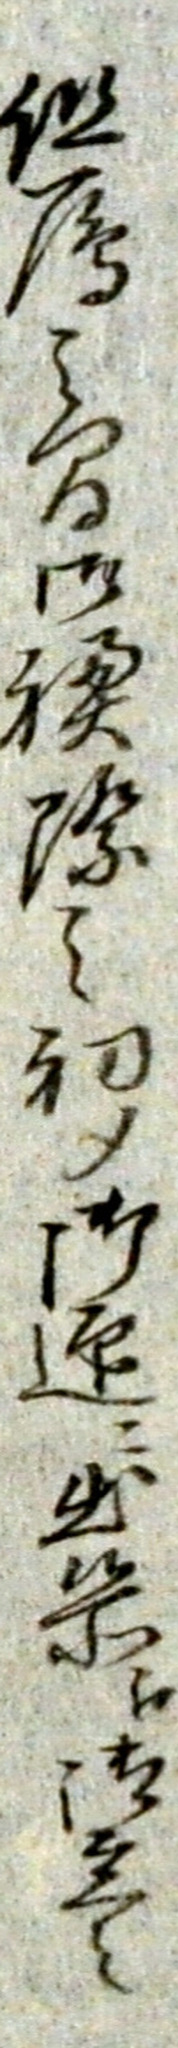但雁之間御襖際之初メ御迎ニ出候所え御立之
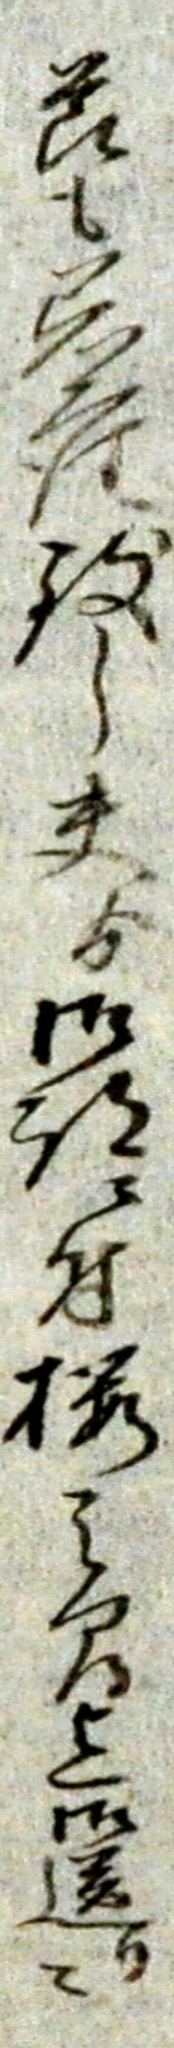節も着座致し夫ゟ御跡ニ付桜之間迄御送りニ
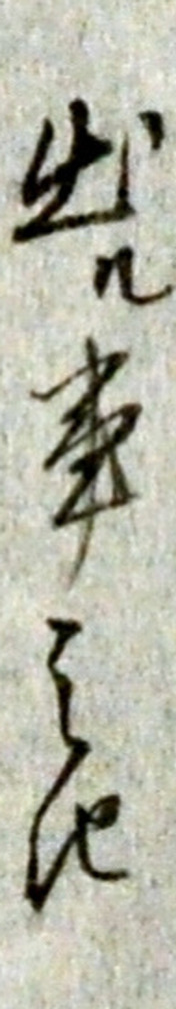出ル事之由
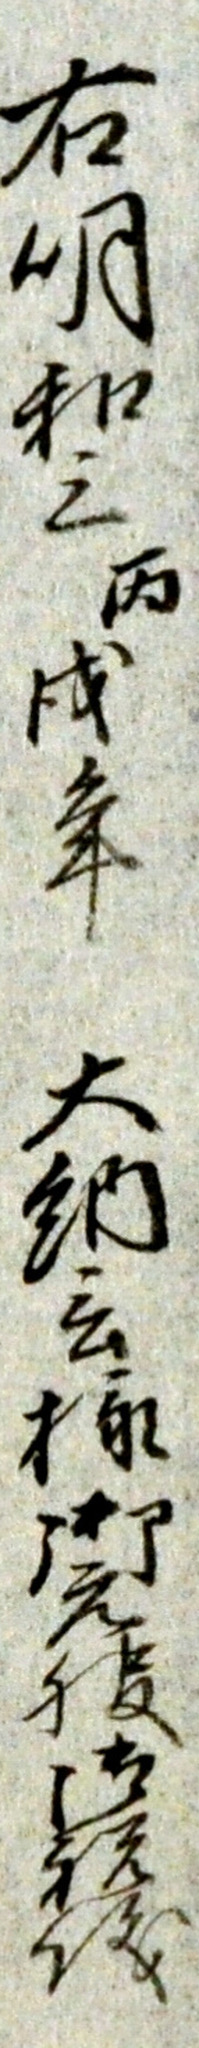右明和三丙戌年大納言様御元服御祝儀
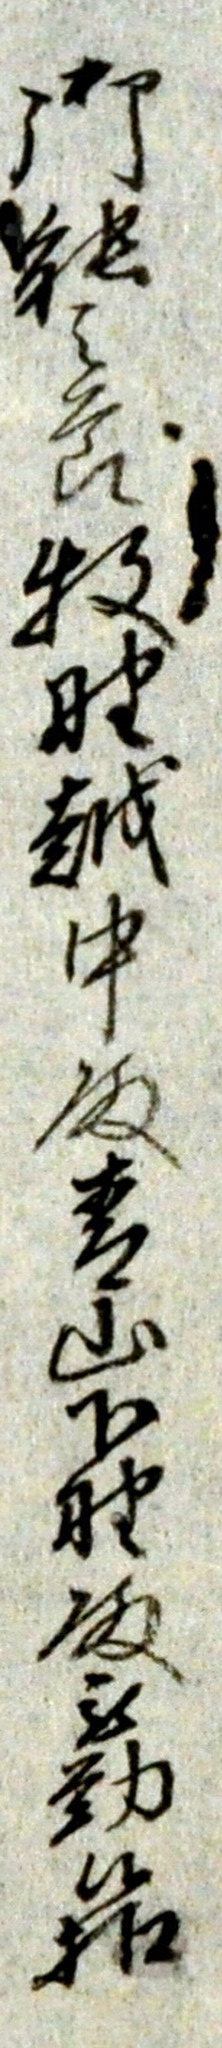御能之節牧野越中殿青山下野殿被勤候様
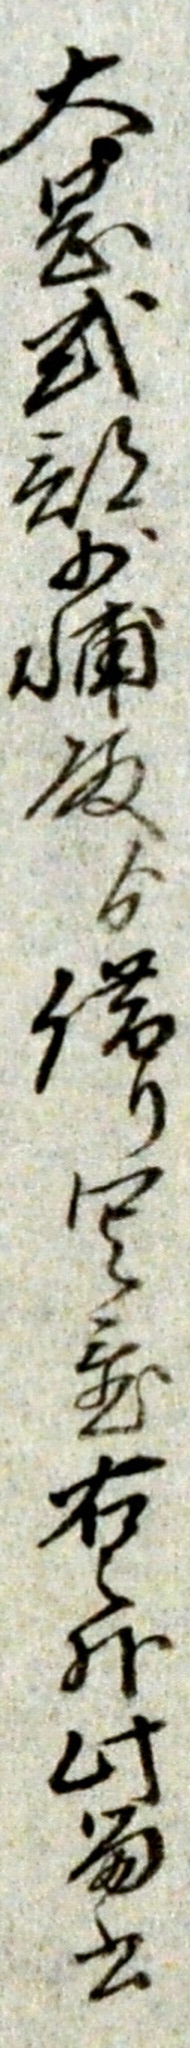大岡式部少輔殿ゟ借り写置右之外此留書
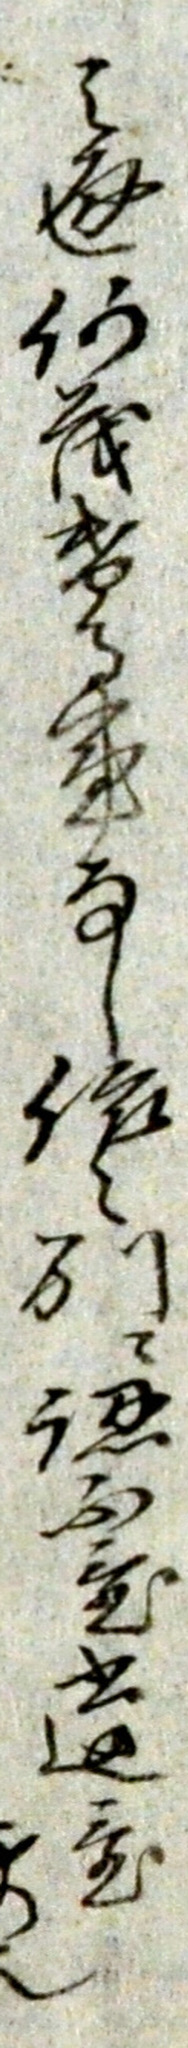之通何も替る事なし依之別ニ認不置書込置もの也

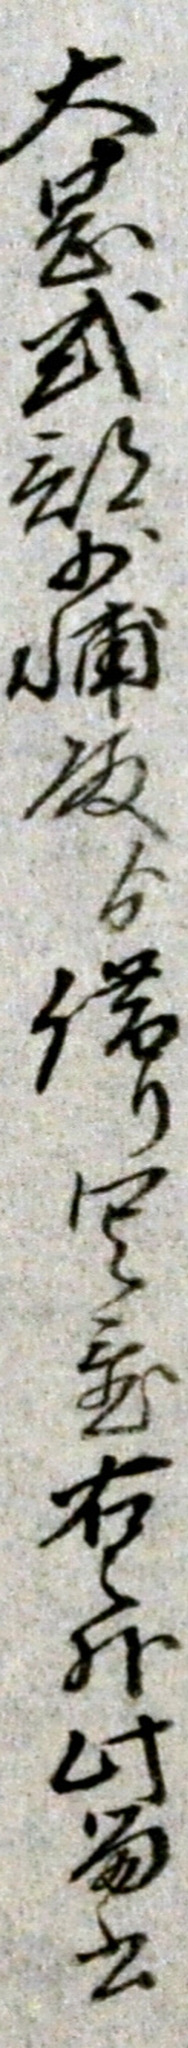大岡式部少輔殿ゟ借り写置右之外此留書
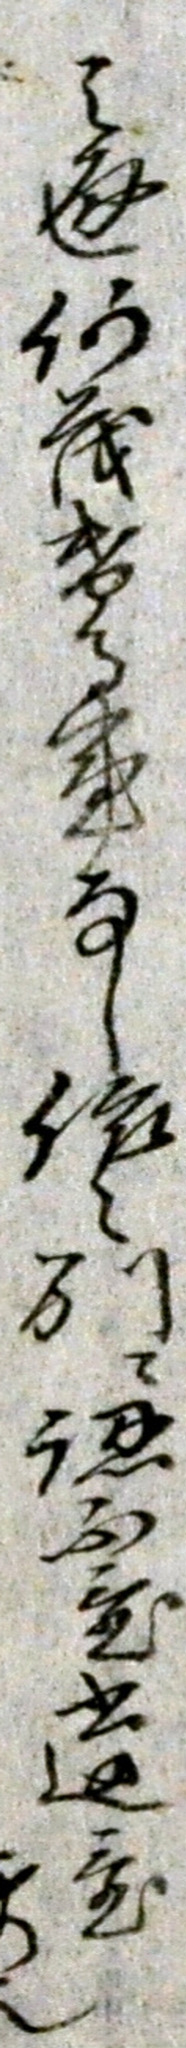之通何も替る事なし依之別ニ認不置書込置もの也
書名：竹ノ間御座席奉行勤方控外
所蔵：伊那市立高遠町図書館・合同会社AMANE
